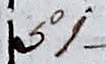51
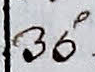35
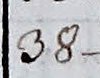38
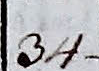34
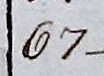67
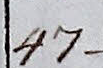47
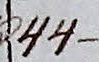44
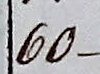60
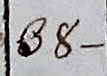38
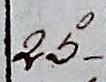25
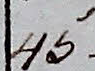45
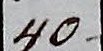40
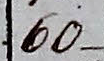60
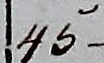45
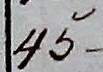45
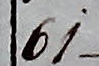61
